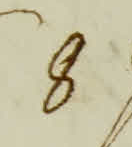8
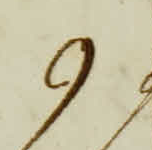9
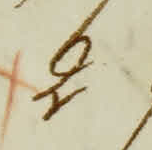2
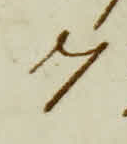7
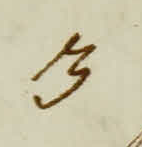3
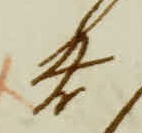4
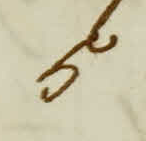5
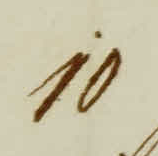10
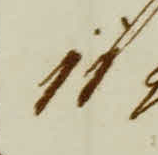11
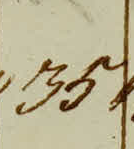35
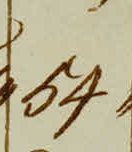54
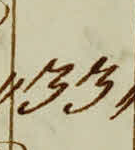33
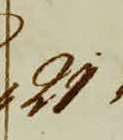21
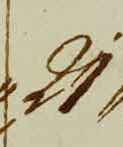21
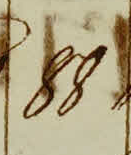88
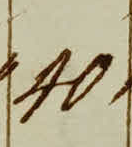40
